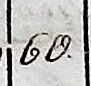60.
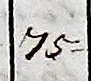75
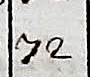72
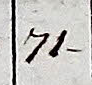71
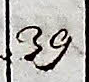39
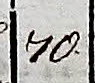70.
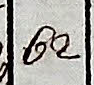62
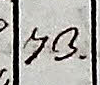73.
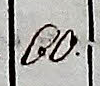60.
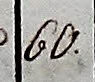60.
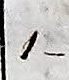1
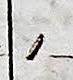1
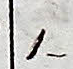1
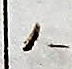1
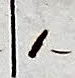1
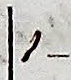1
